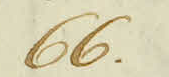66.
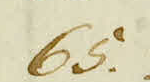65.
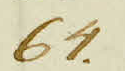64.
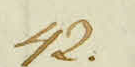42.
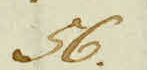56.
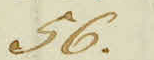56.
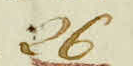26
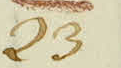23
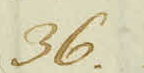36.
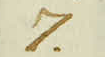7.
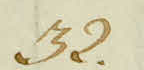32.
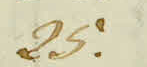25.
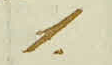1.
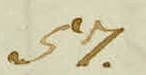57.
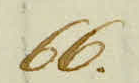66.
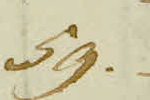59.
